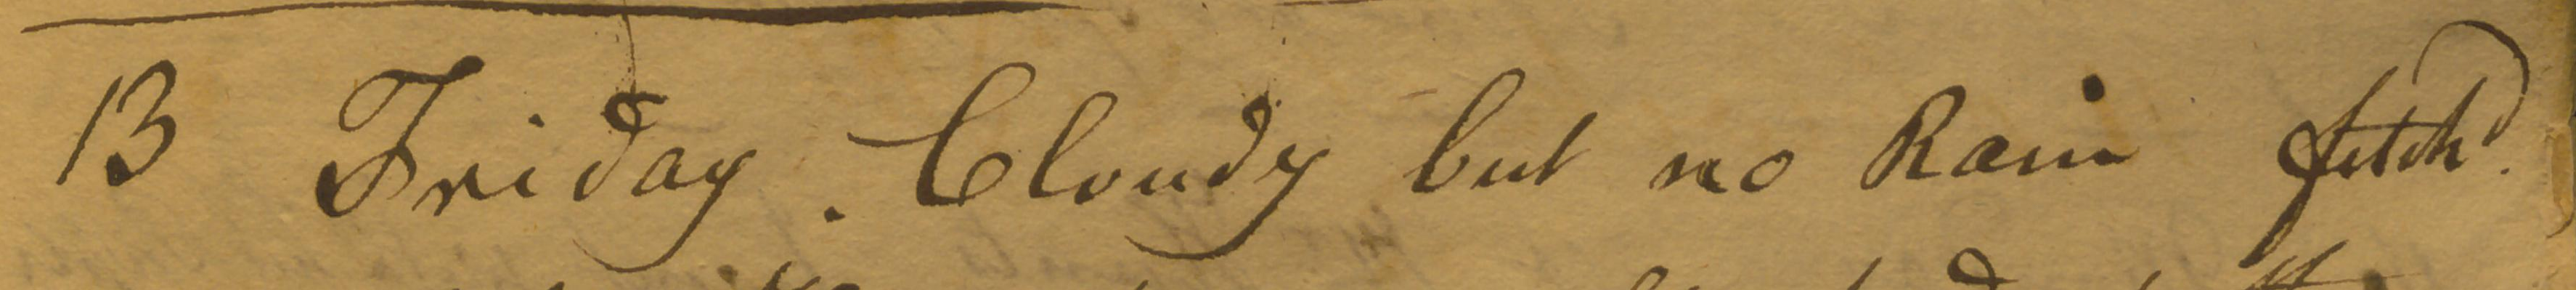13 Friday, Cloudy but no Rain fetch^d.
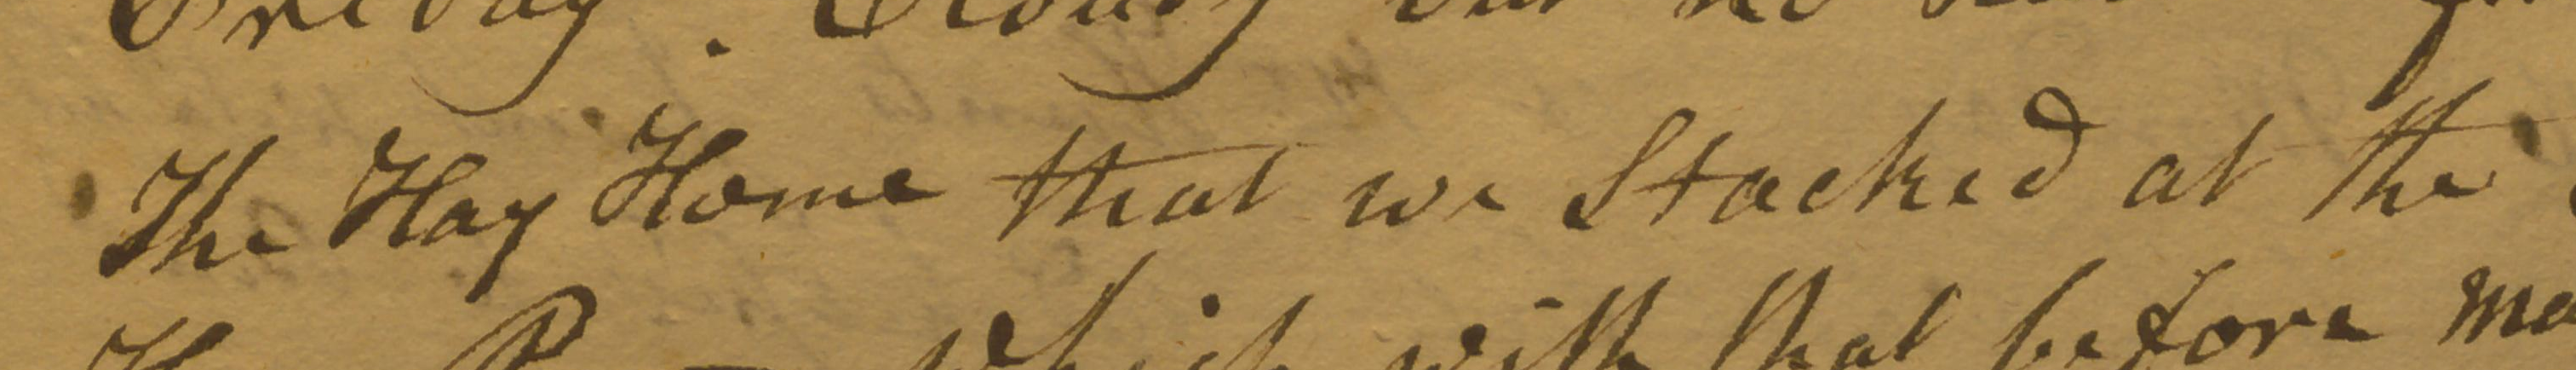The Hay Home that we Stacked at the
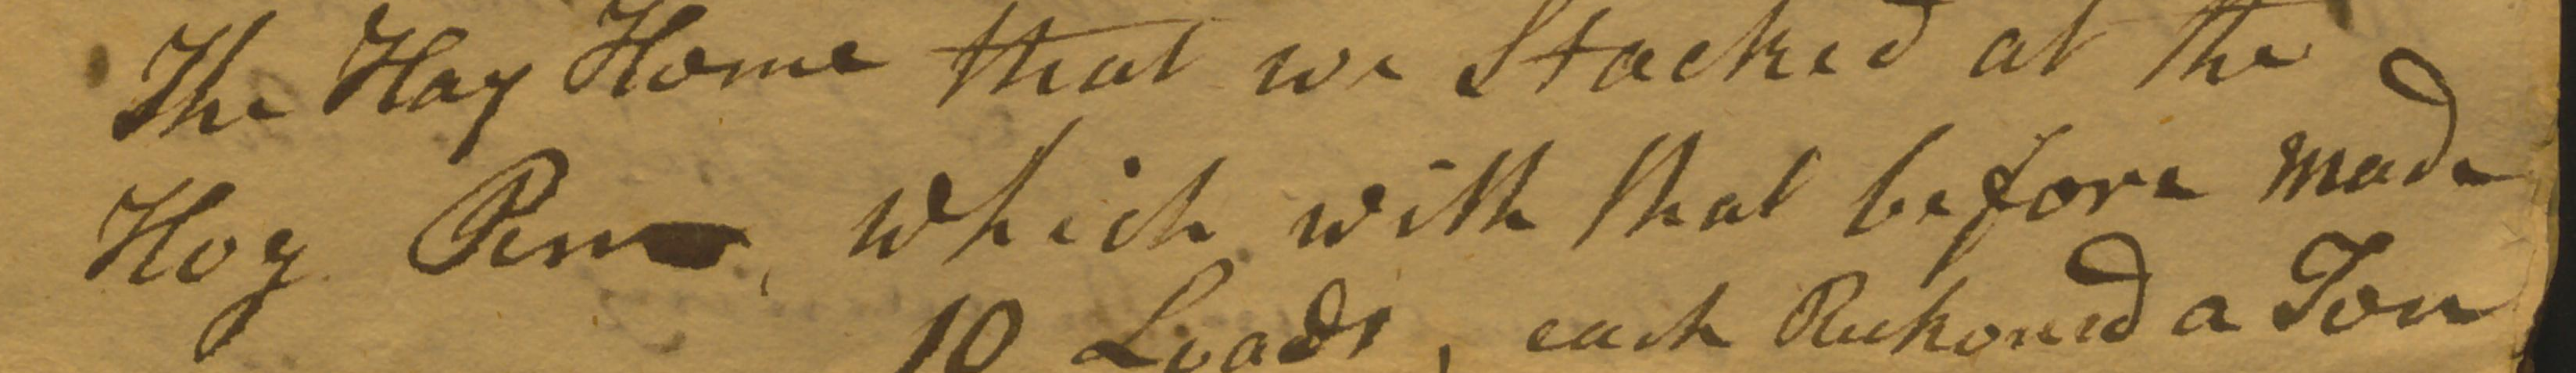Hog Pen which with that before Made
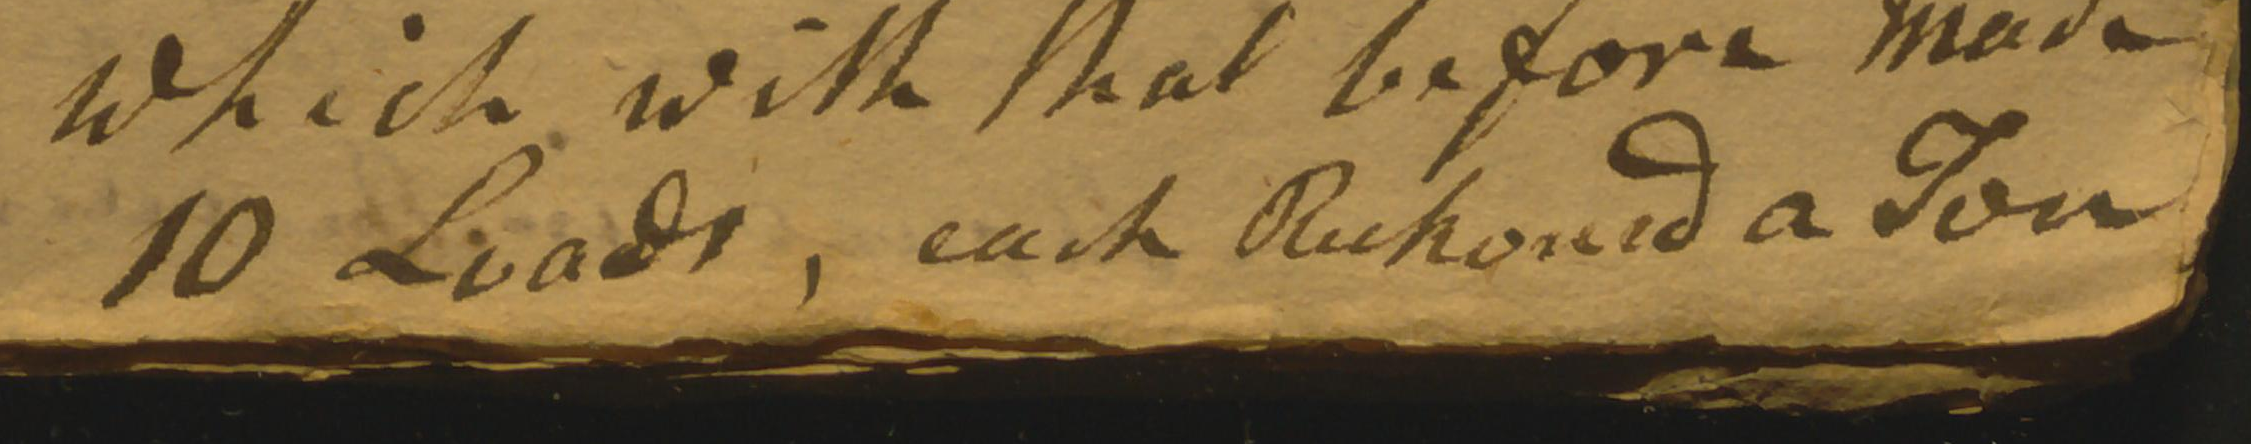10 Loads, each Reckoned a Ton
